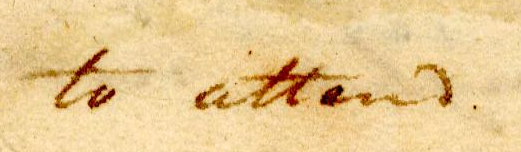to attend
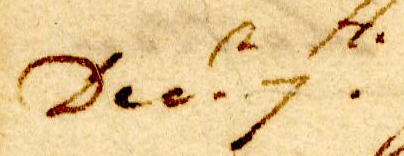Dec^r. 7^th.
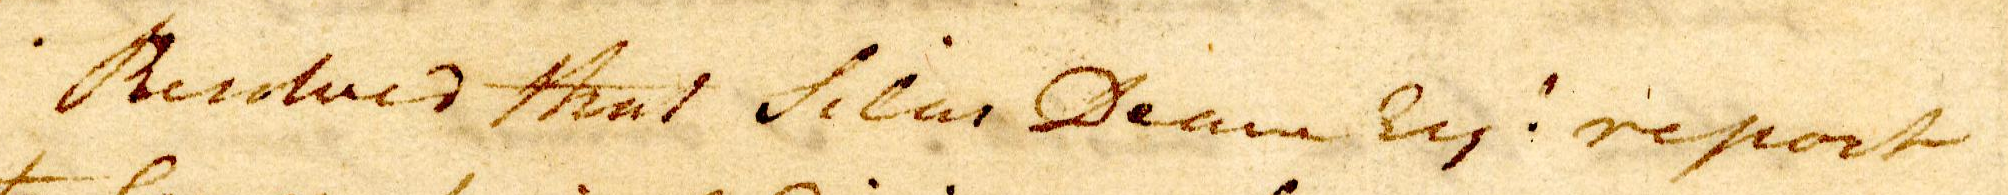Resolved that Silas Deane Esq^r. respect
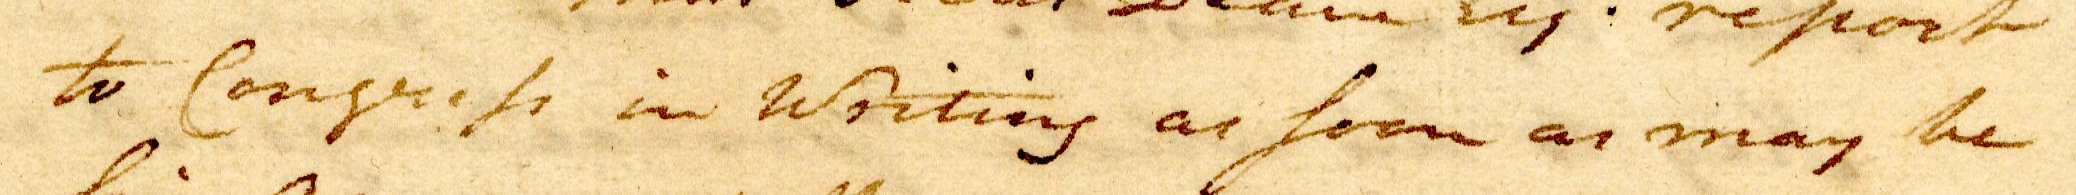to Congress in Writing as soon as may be
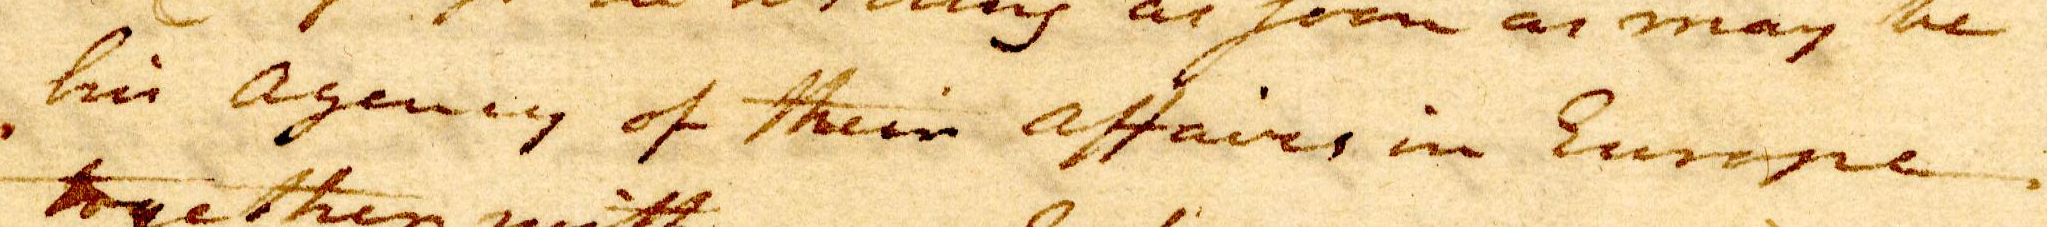his agency of their affaires in Europe.
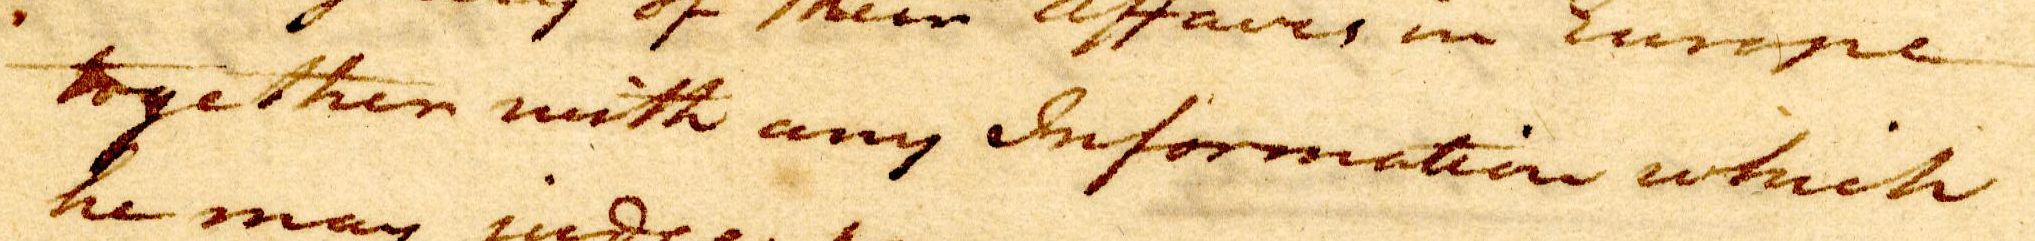together with any Information which
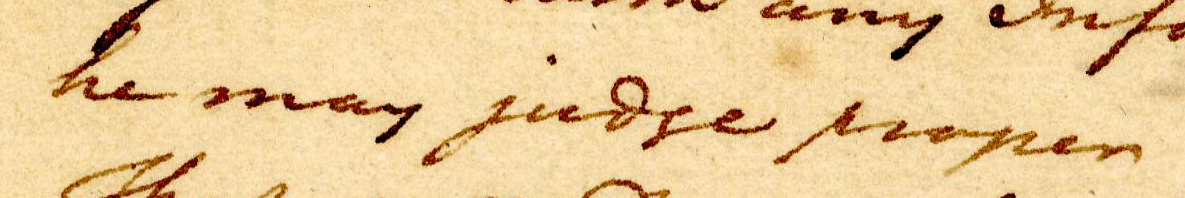he may judge proper
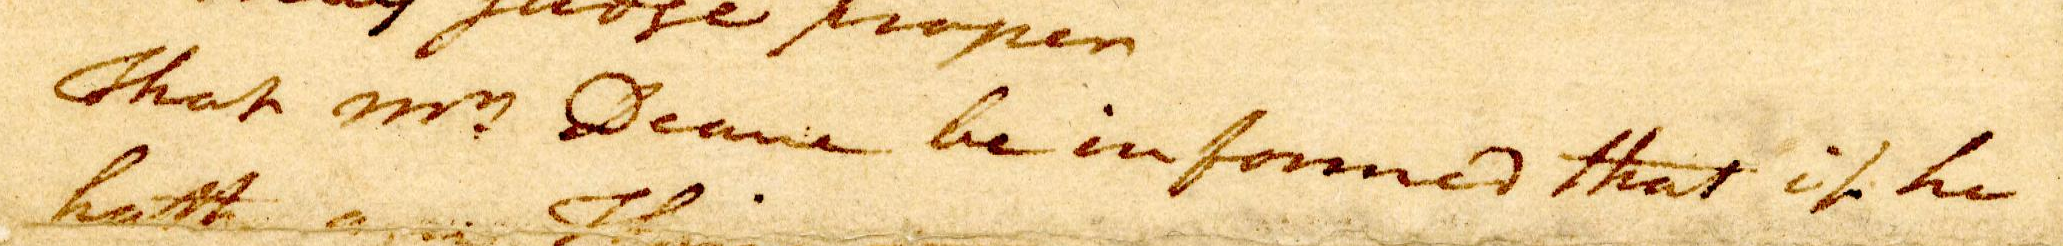That M^r. Deane be informed that if he
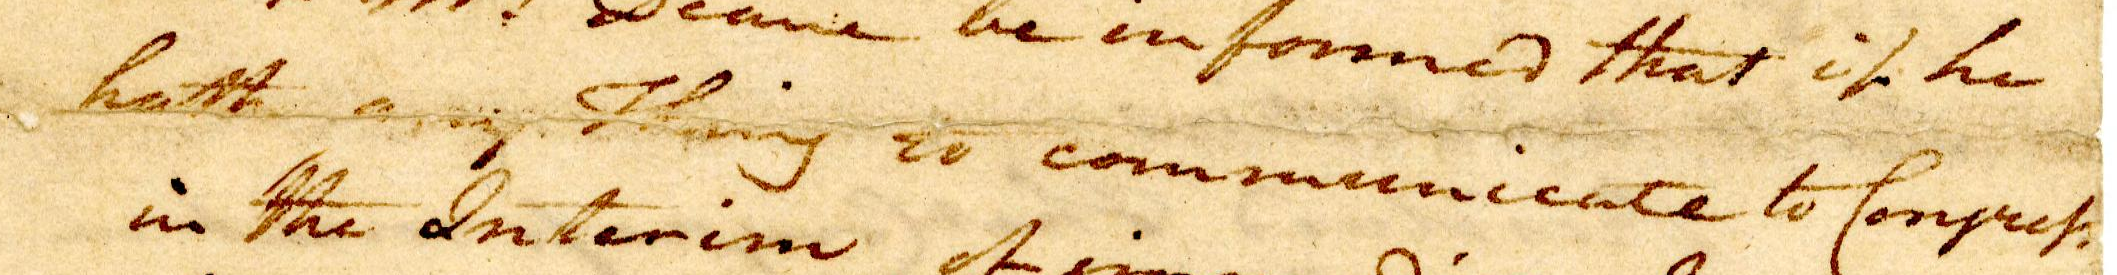hath anything to communicate to Congress
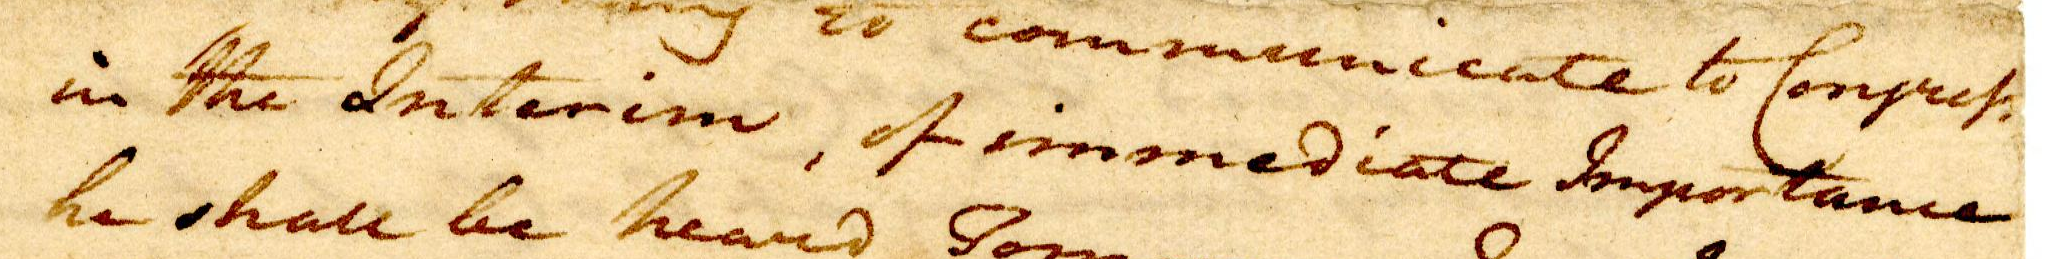in the Interim, of immediate Importance
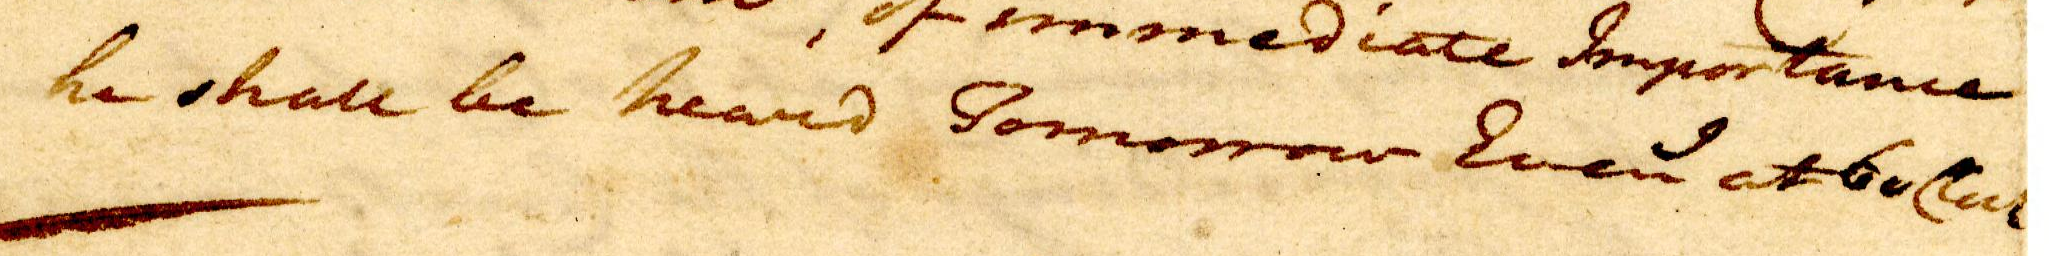he shall be heard Tomorrow Even^g at 6 oClock
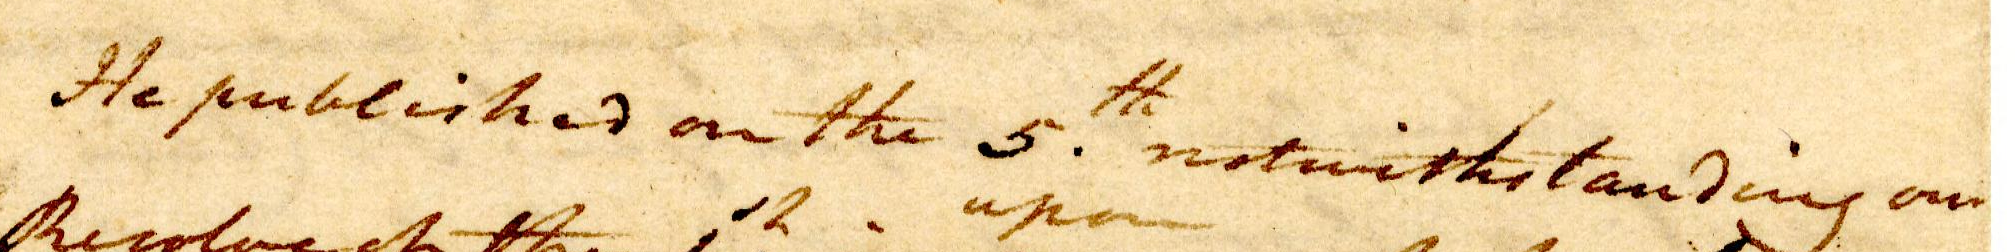He published on the 5^th. notwithstanding an
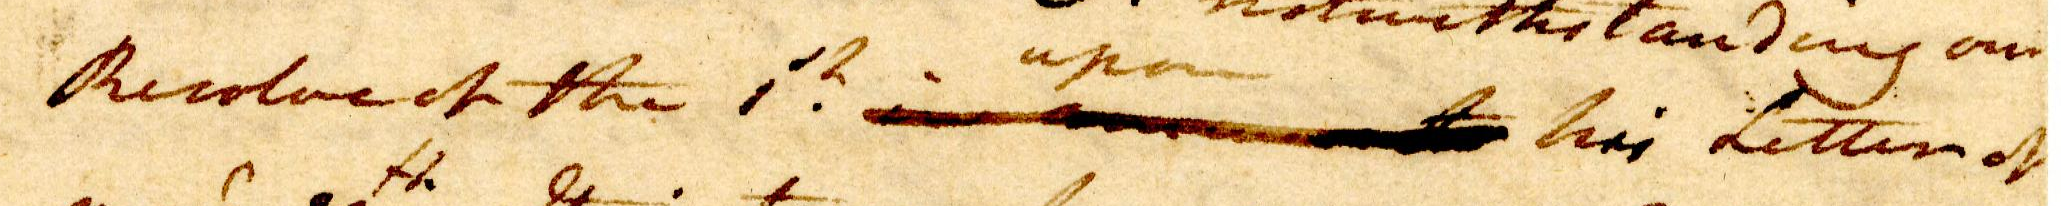Resolve the 1^st. [________] his Letter of
